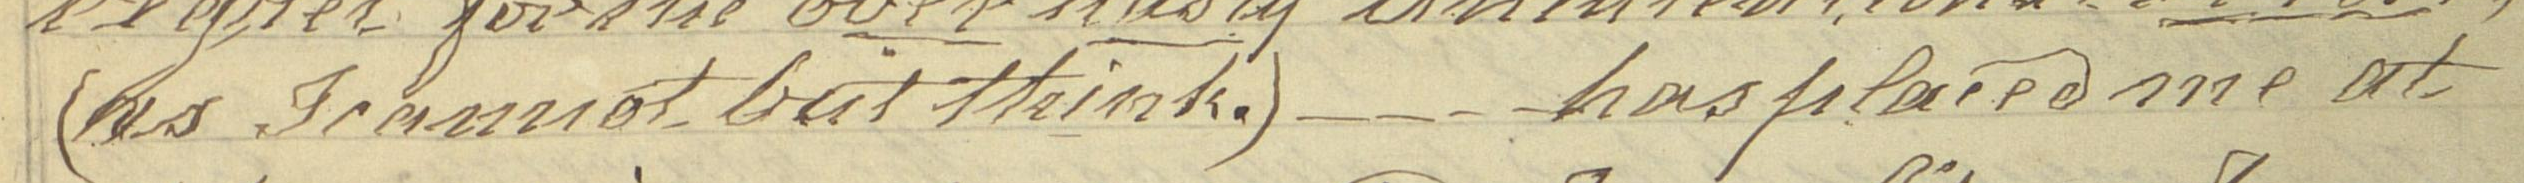(as I cannot best think.) has placed me at
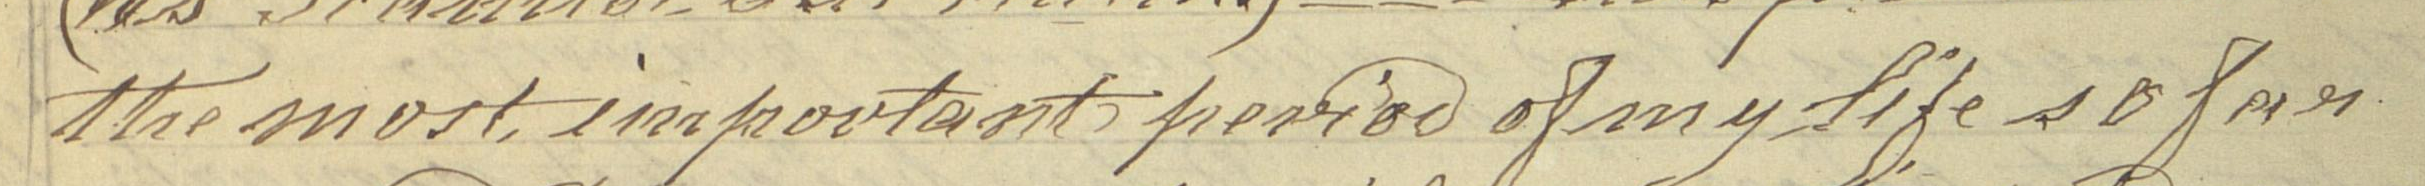the most important period of my Life so far
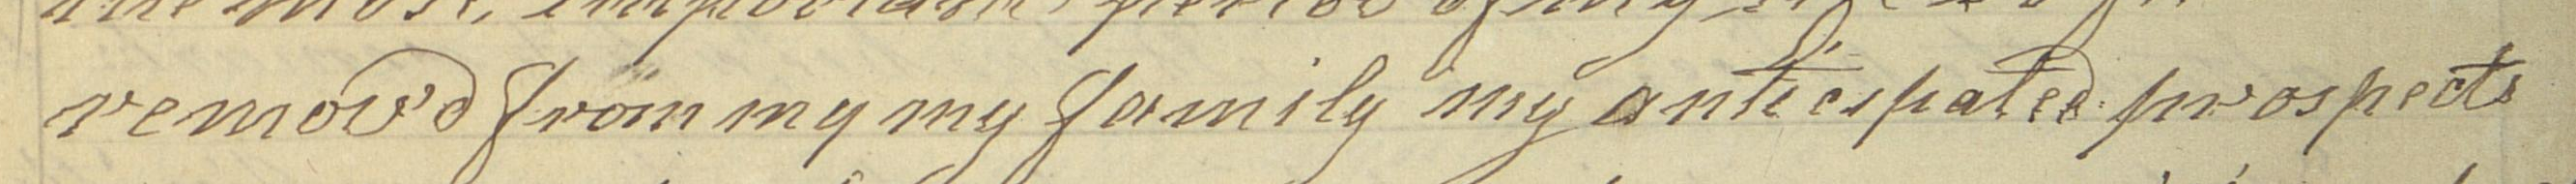remov'd from my my family my anticipated prospects
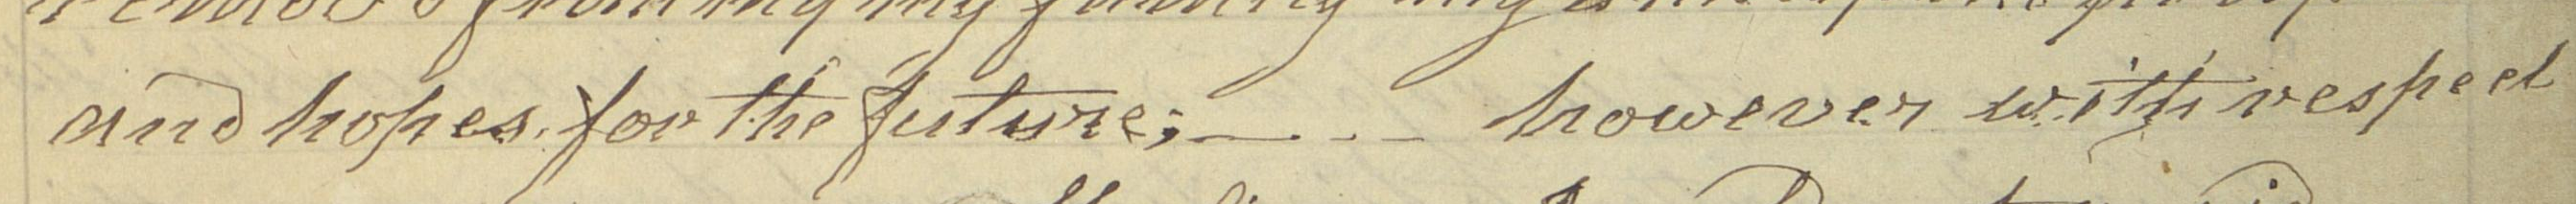and hopes for the future; however with respect
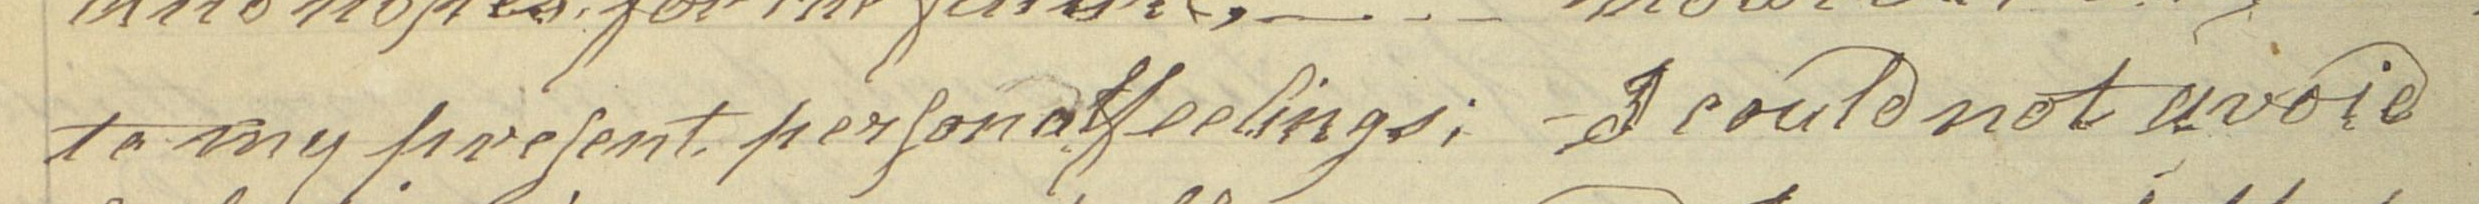to my present personal feelings; I could not avoid
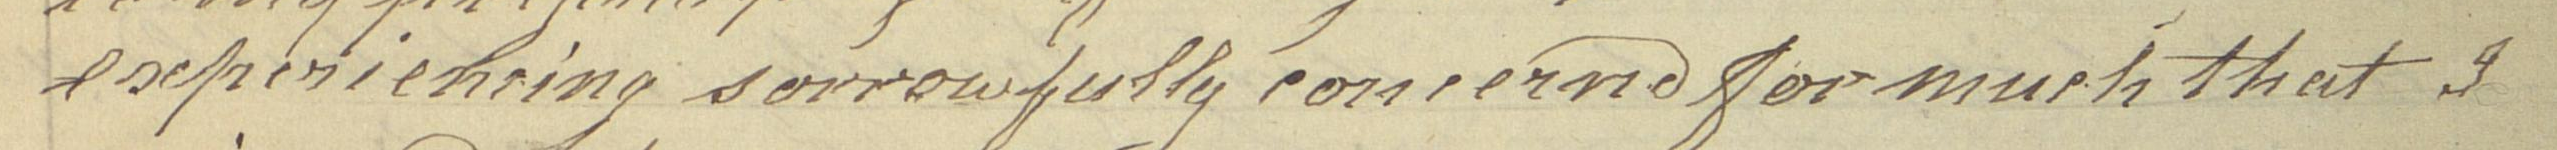experiencing sorrowfully concernd for much that I
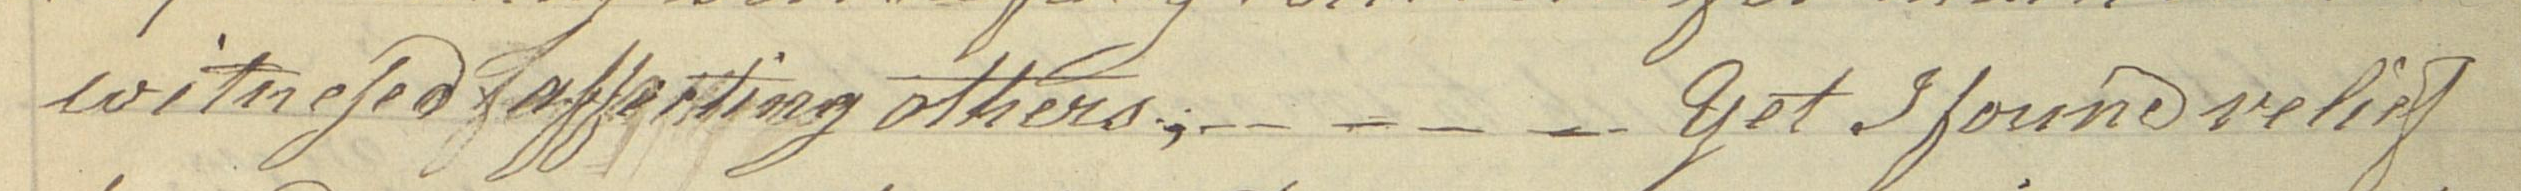witnessed affecting others, Yet I found relief
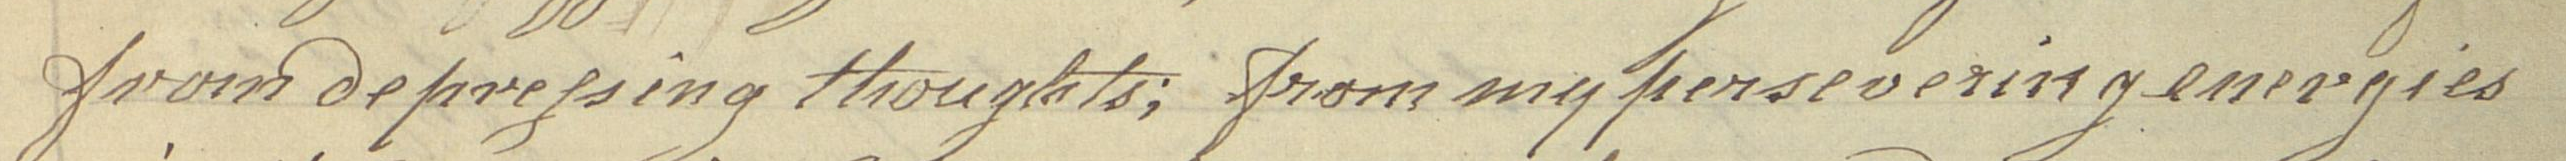from depressing thoughts; from my persevering energies
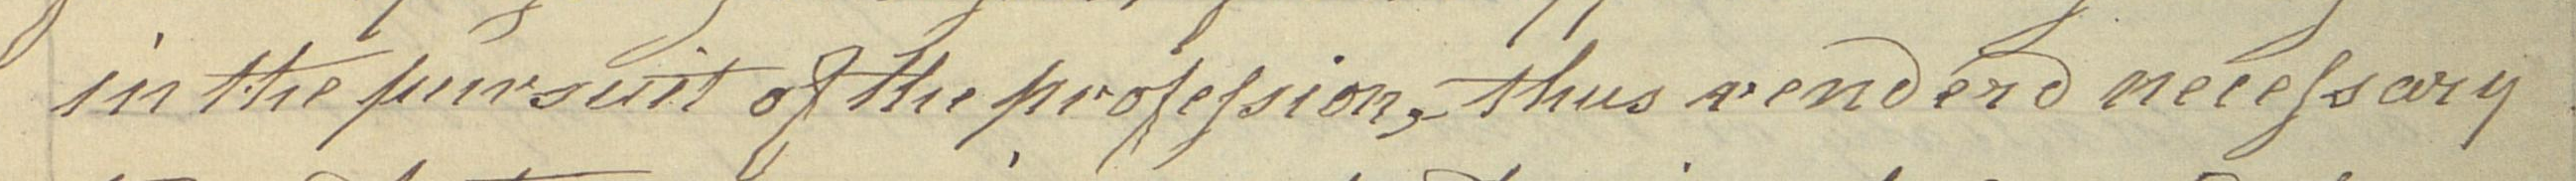in the pursuit of the profession, thus renderd necessary
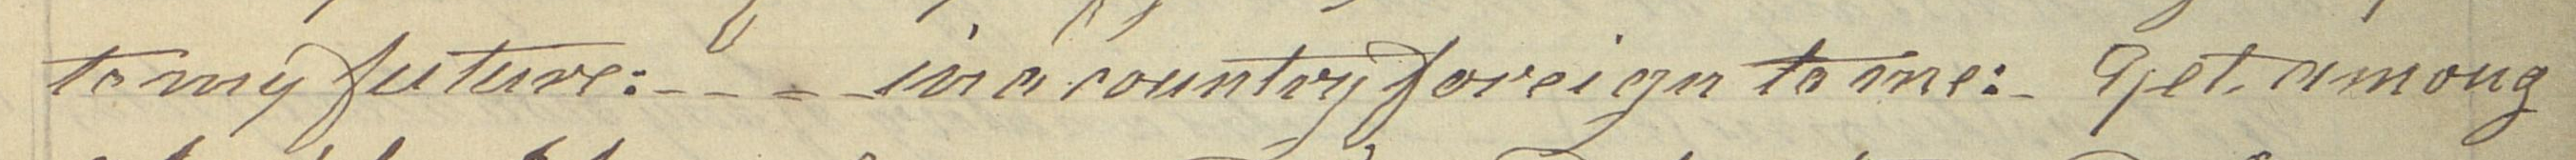to my future. in a country foreign to me: Yet among
